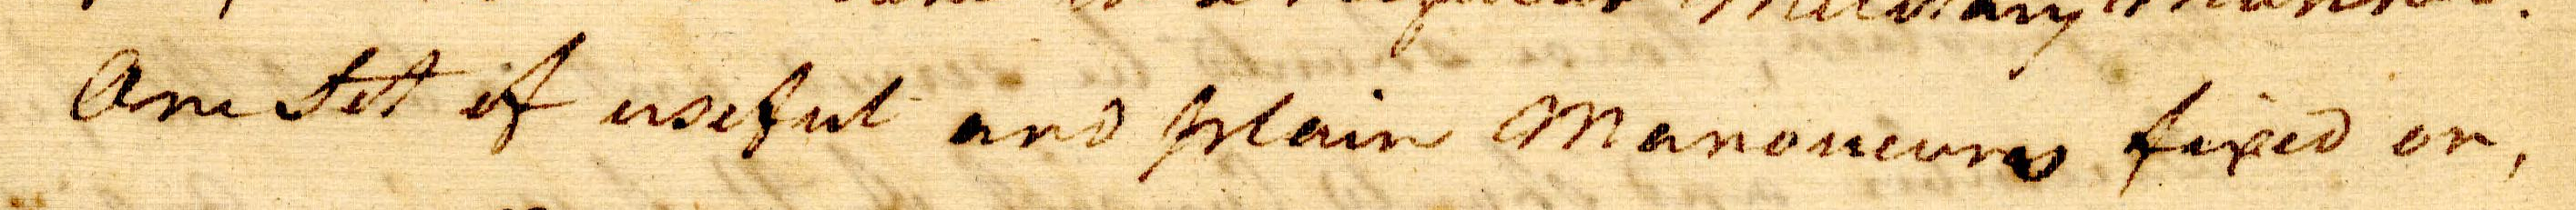One set if useful and plain manouevrs fixed on,
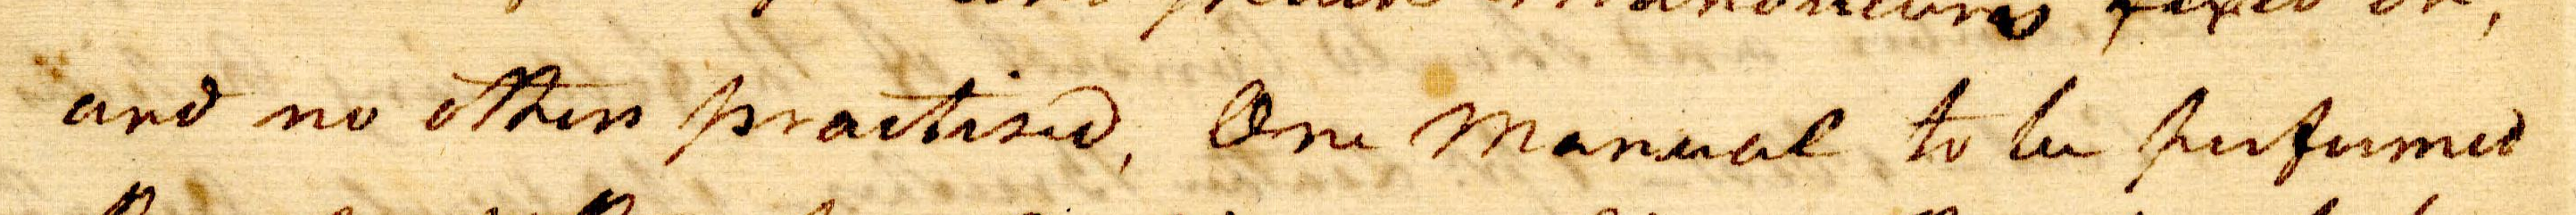and no others practiced, One manual to be performed
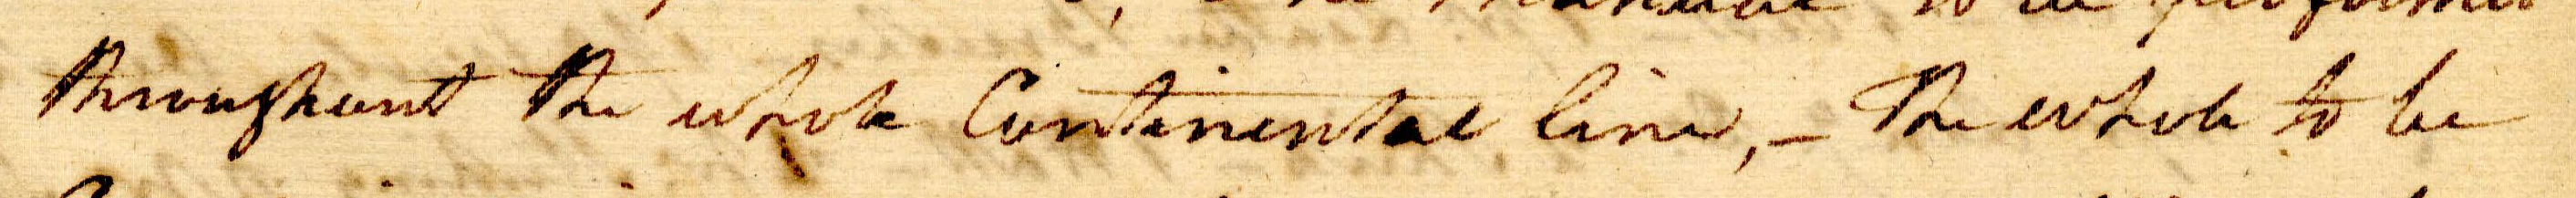throughout the whole Continental line,- The whole to be
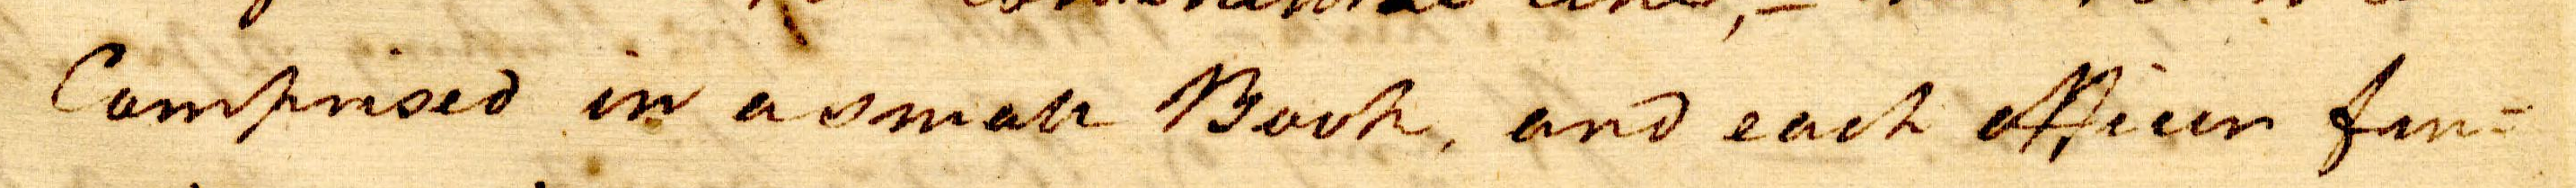Comprised in a small Book, and each officer fur-
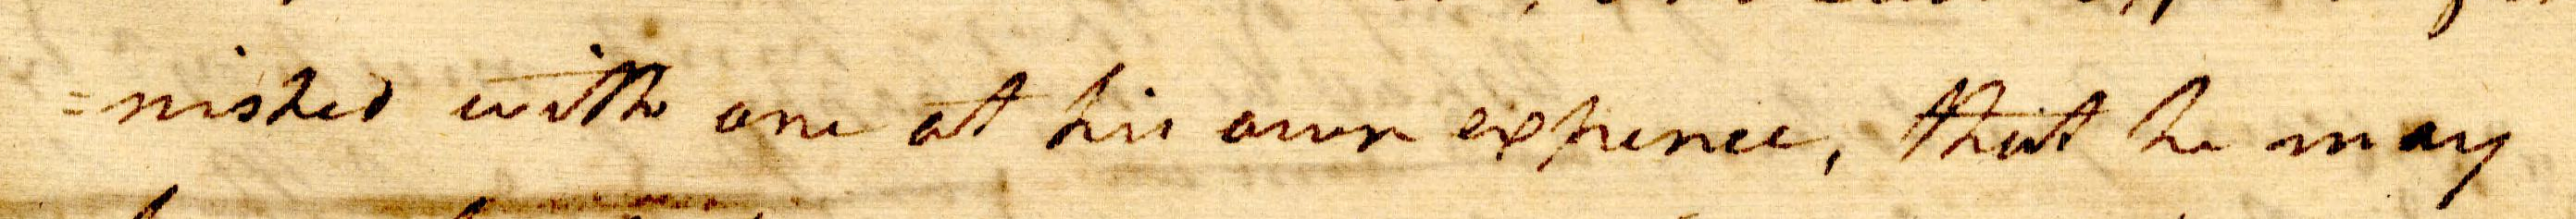-nished with one at his own expence, that he may
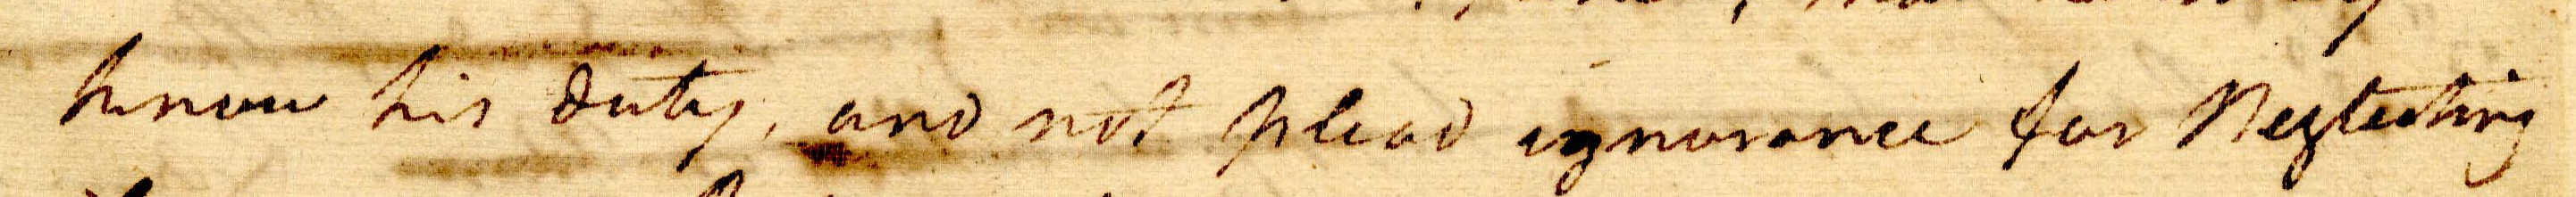know his duty, and not plead ignorance for neglecting
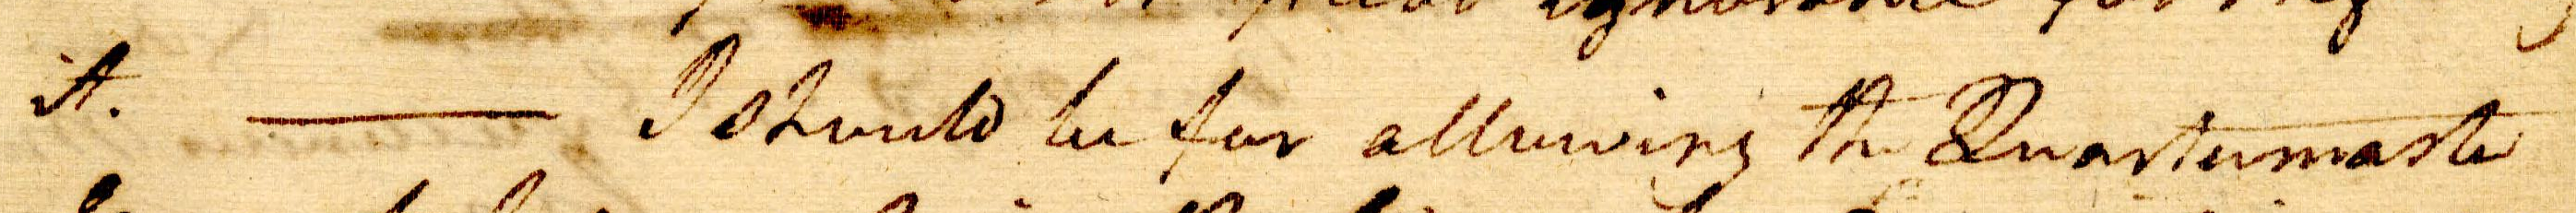it.- I should be for allowing the Quartermaster
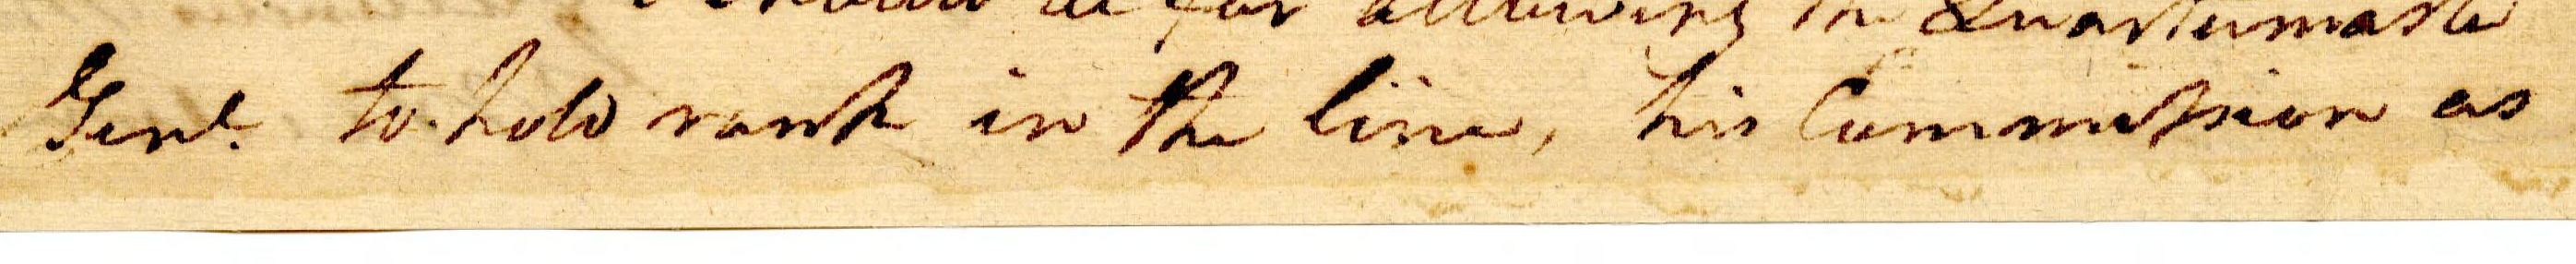Gen^l. to hold rank in the line, his Commission as
